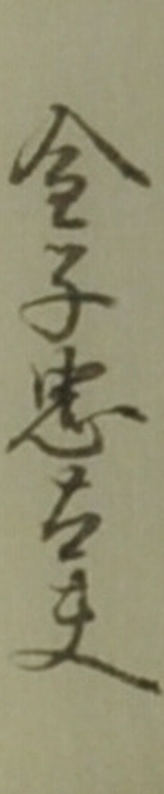金子忠太夫

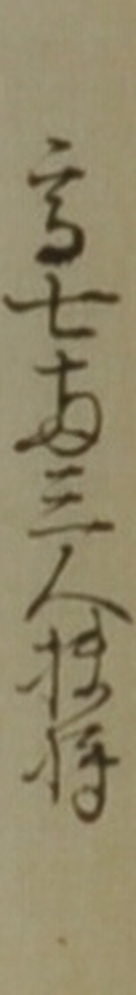高七両三人扶持
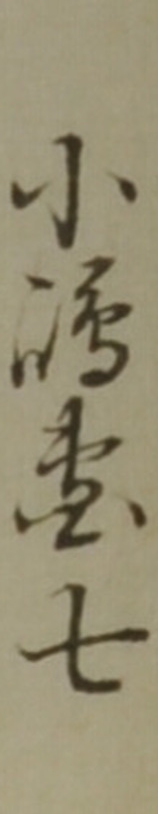小嶋團七
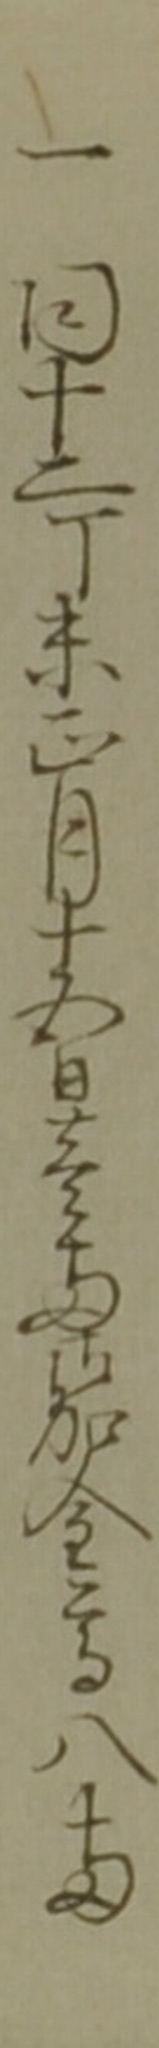一同十二丁未正月十五日壱両御加金高八両
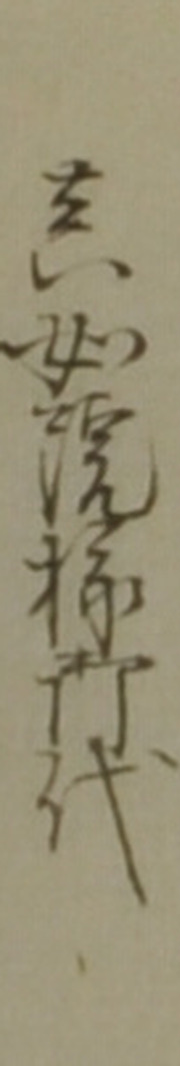真如院様御代
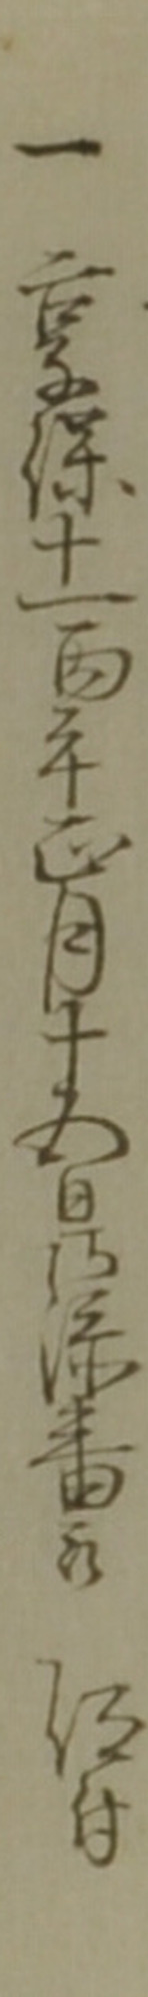一享保十一丙午正月十五日御添番被仰付
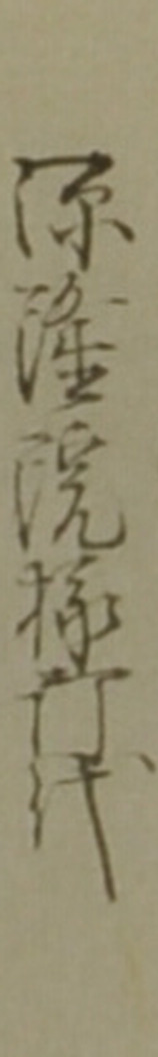源隆院様御代
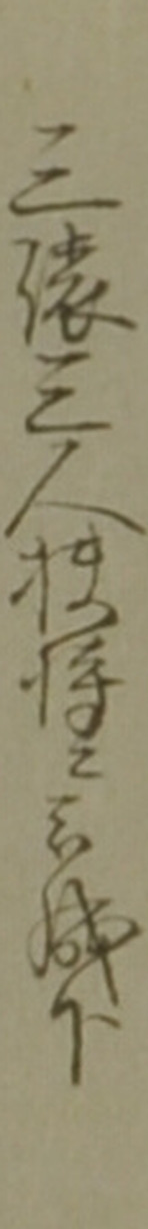三俵三人扶持ニ被成下
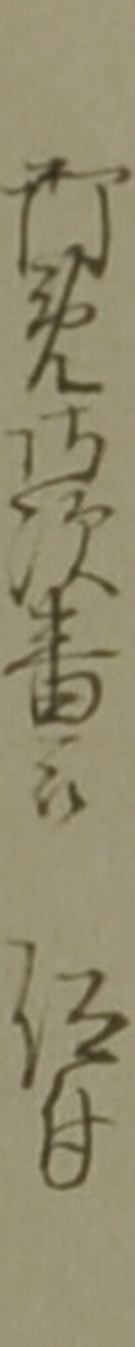御免御次番被仰付
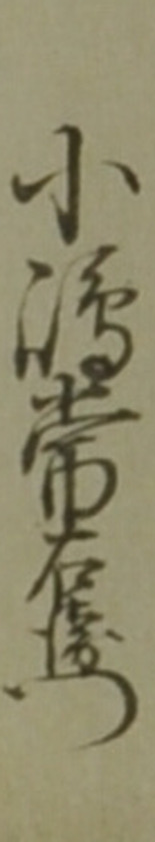小嶋常右衛門

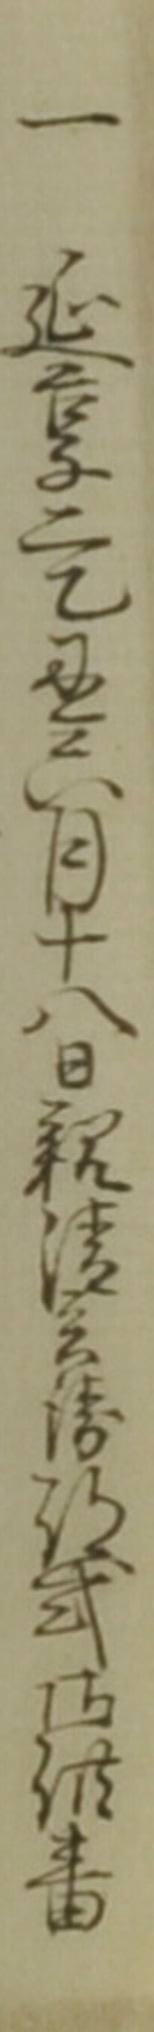一延享二乙丑六月十八日親清兵衛跡式御供番
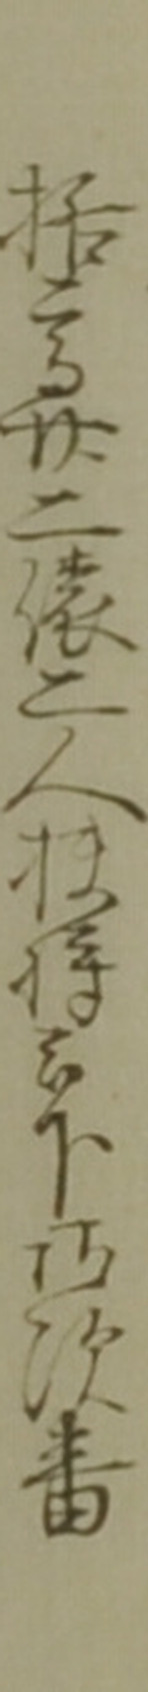格高廿二俵二人扶持被下御次番
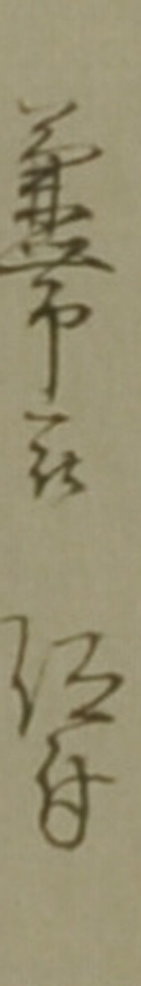兼帯被仰付
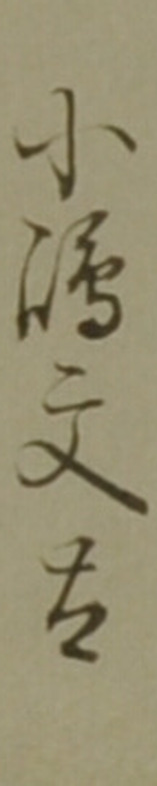小嶋文太
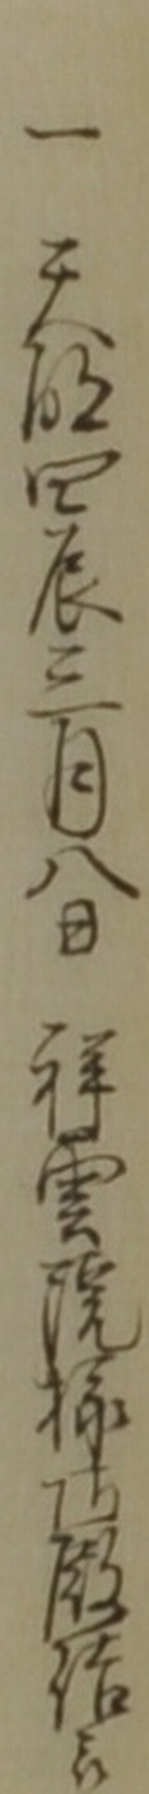一天明四辰三月八日祥雲院様御殿詰被
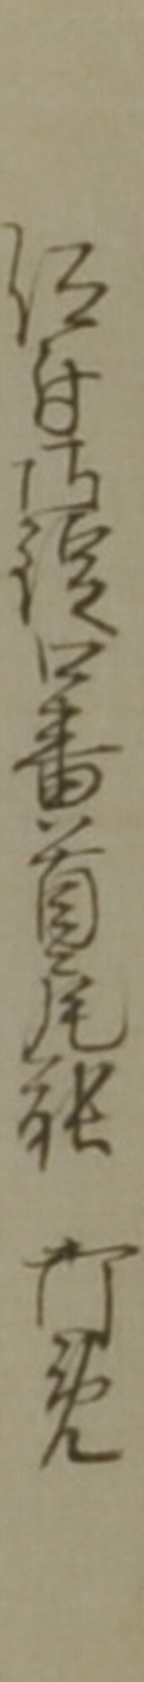仰付御錠口首尾能御免
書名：無足諸士勤仕録（五）
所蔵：伊那市立高遠町図書館・合同会社AMANE
